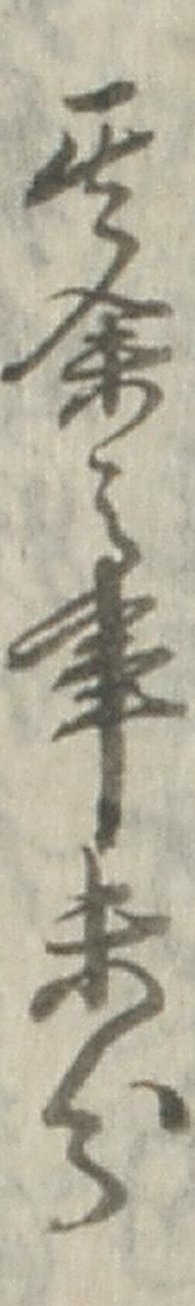其余之事未分
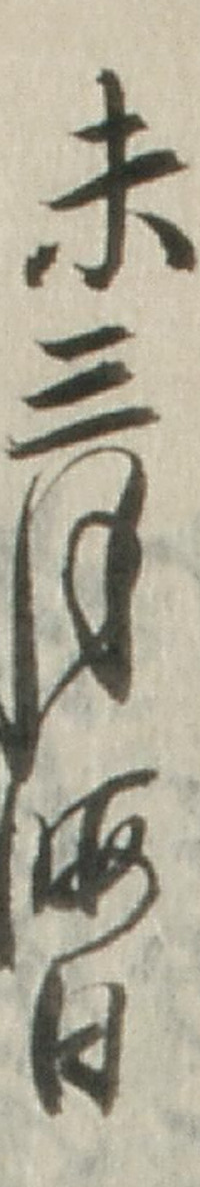未三月晦日
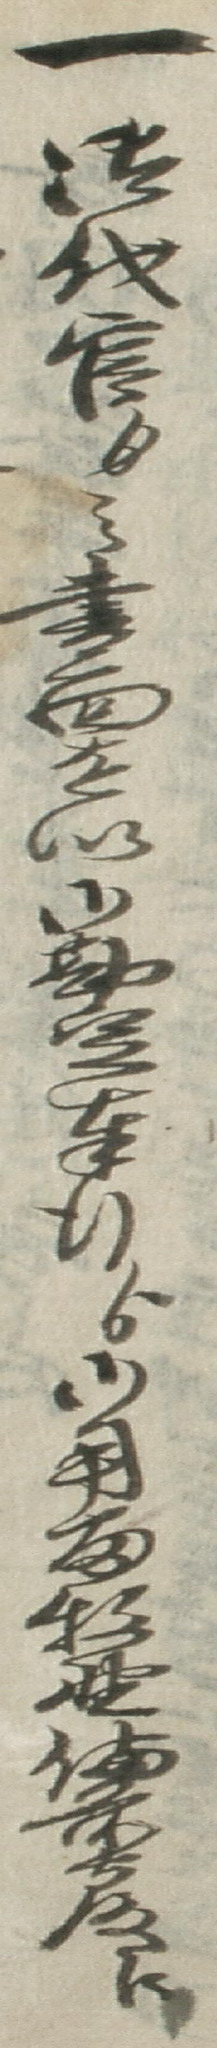一御代官ゟ之書面を以御勘定奉行ゟ御用番牧野備前守殿江
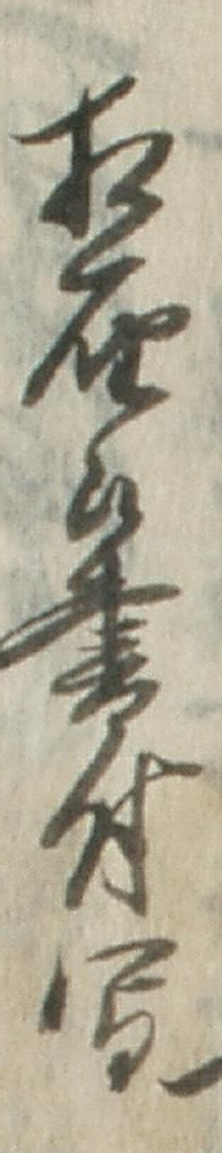相届候書付写
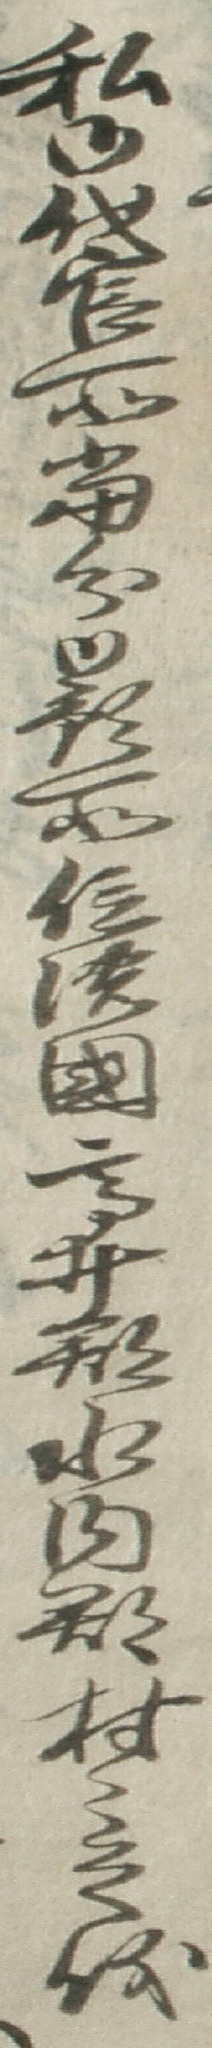私御代官所当分御預所信濃国高井郡水内郡村々之儀
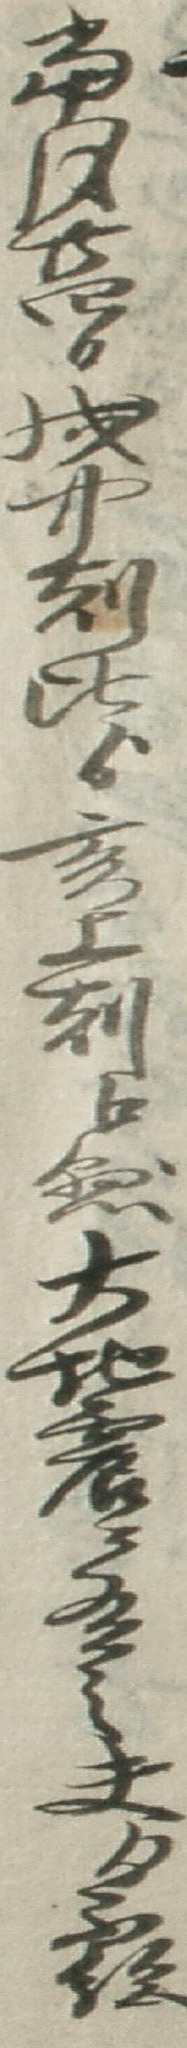当月廿四日戌中刻比ゟ亥上刻江懸大地震二有之夫ゟ不絶
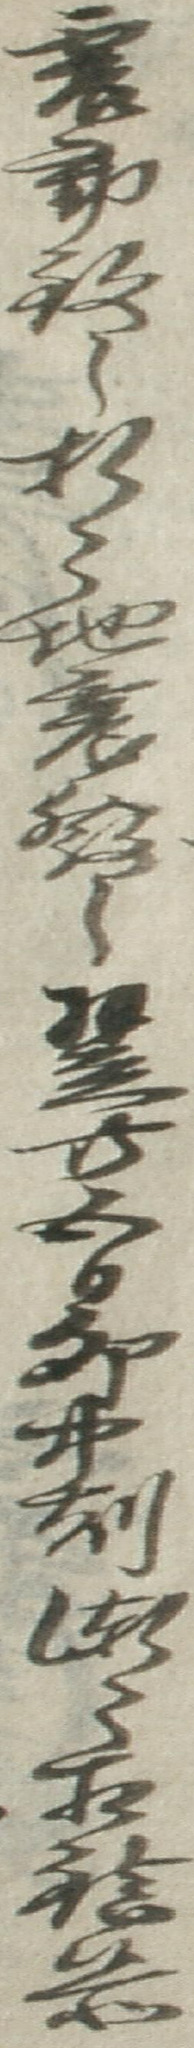震動致ㇱ折々地震発し翌廿五日卯中刻漸々相鎮候所
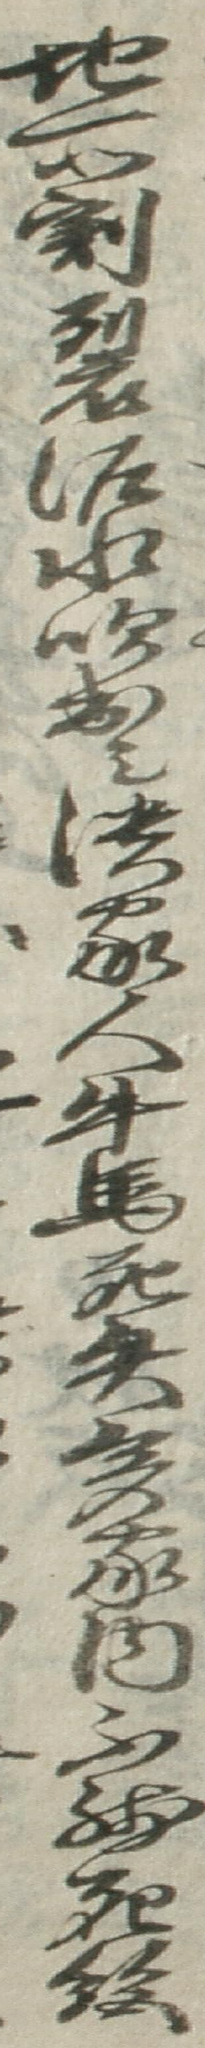地所割裂泥水吹出シ潰家人牛馬死失多家内不残死絶
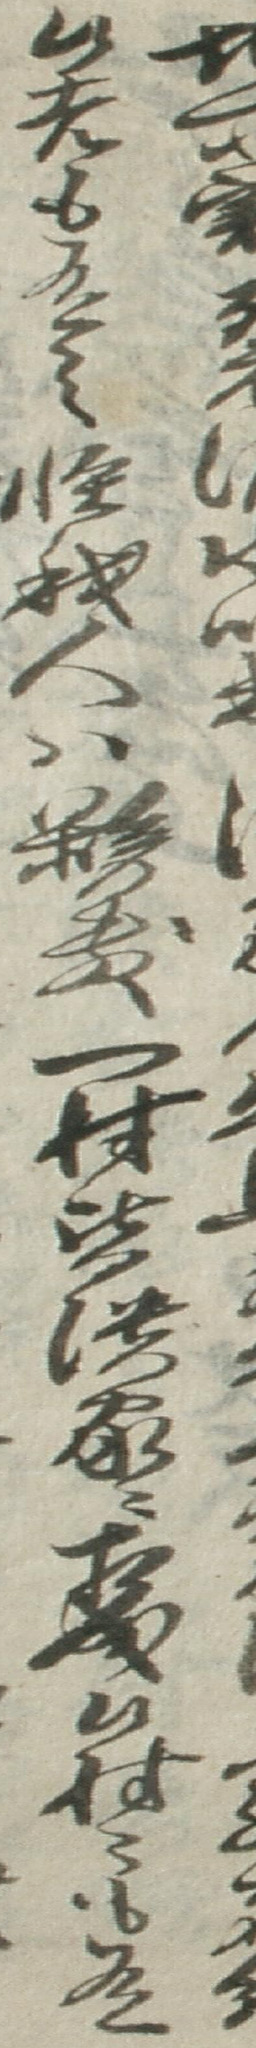候者も有怪我人は夥敷一村皆潰家二相成候村々も有
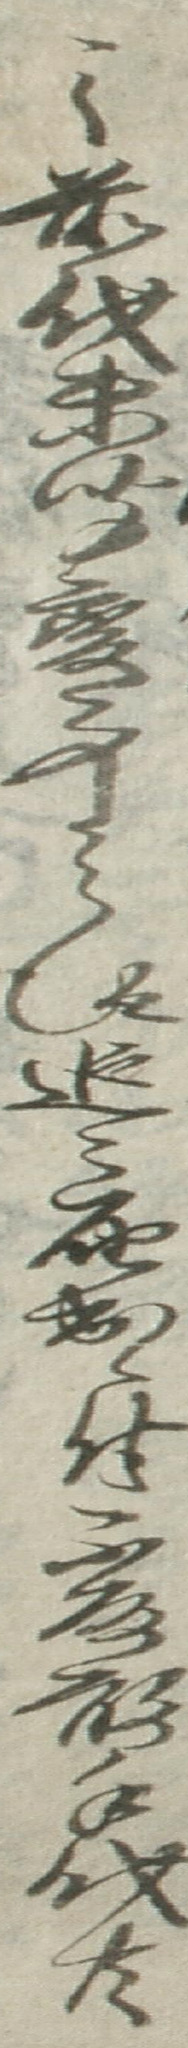之前代未聞変事之趣追々届出候付不取敢手代共
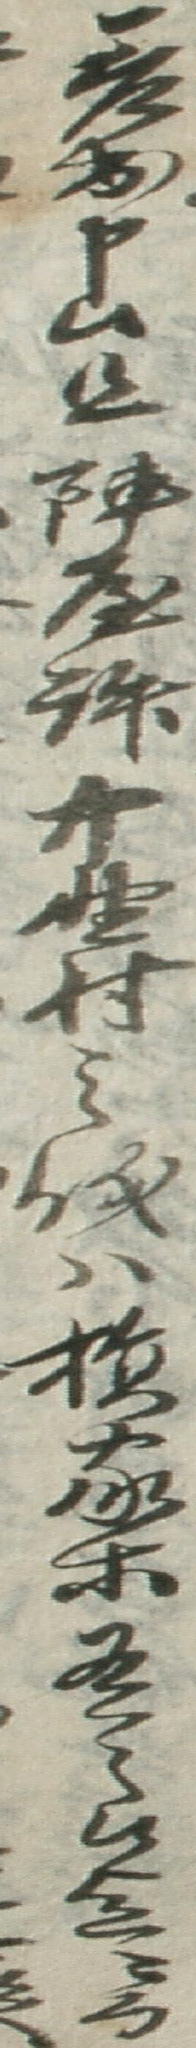差出申候且陣屋許中野村之儀ハ損家有之候迄二而
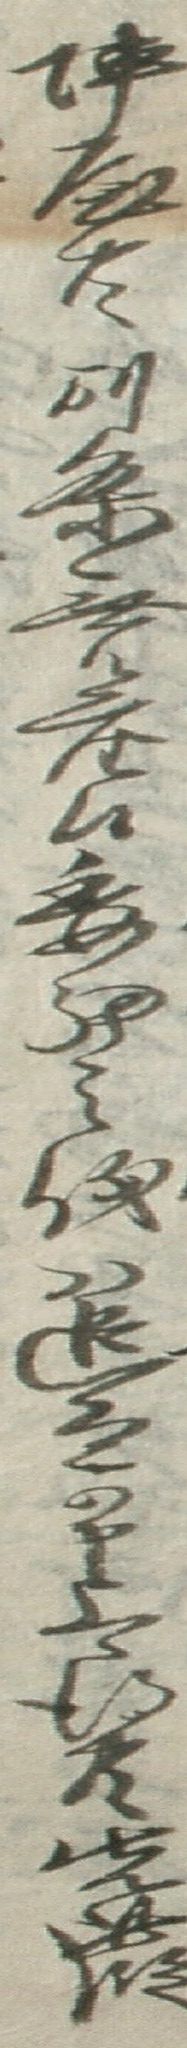陣屋共別条無御座候委細之儀ハ追而可申上候得共先此段
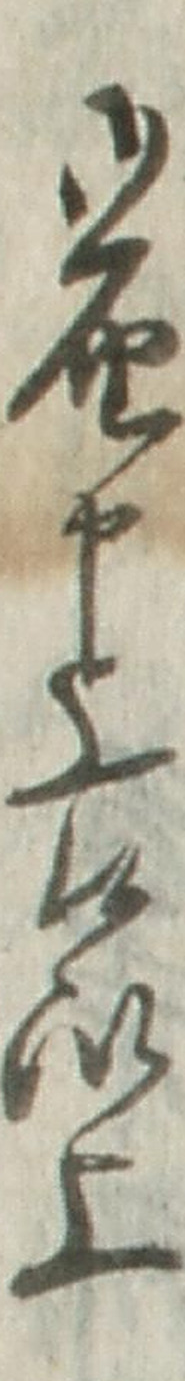御届申上候以上
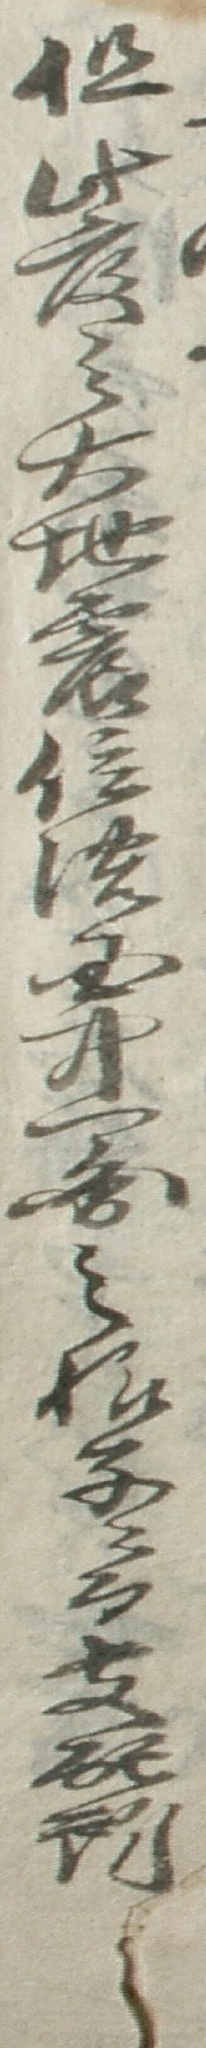但此度之大地震信濃国第一番之様子二而支配所

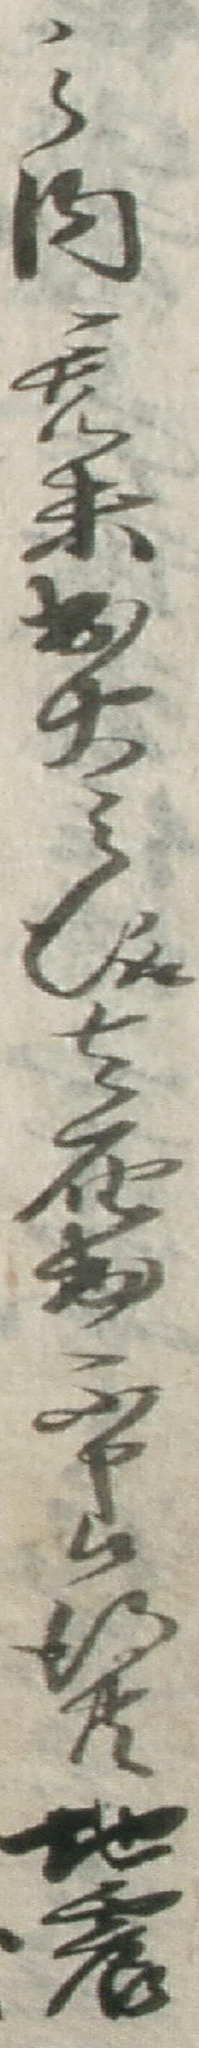之内二は未出火候趣は届出不申候得共地震
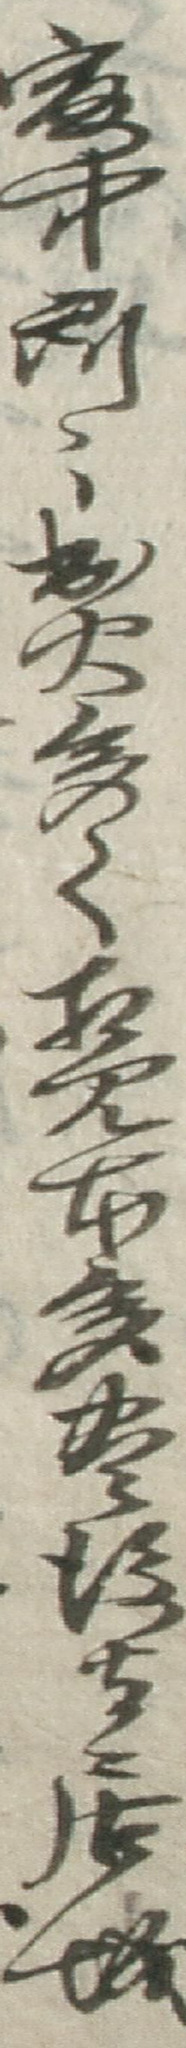最中所々出火多く相見本多豊後守居城
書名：信濃國地震實録記
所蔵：東京大学地震研究所図書室 Earthquake Research Institute Library, The University of Tokyo, JAPAN
